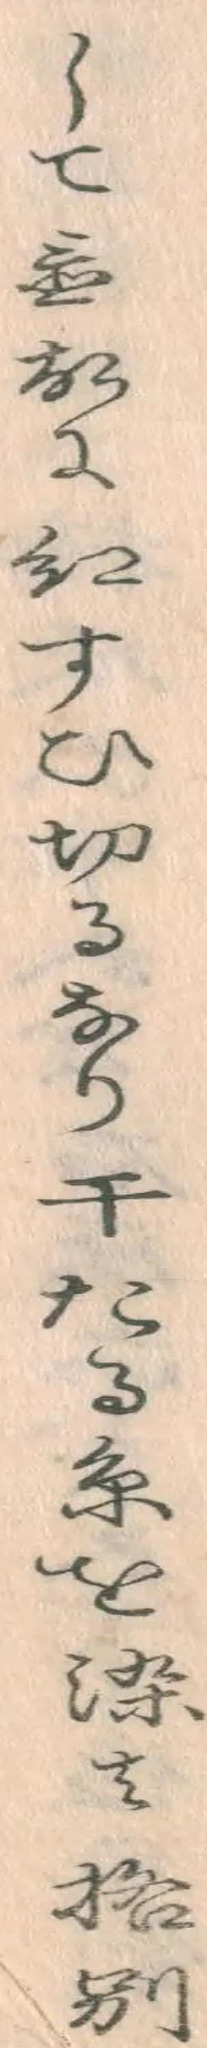して置故に紅すひ切るなり干たる糸を染は格別
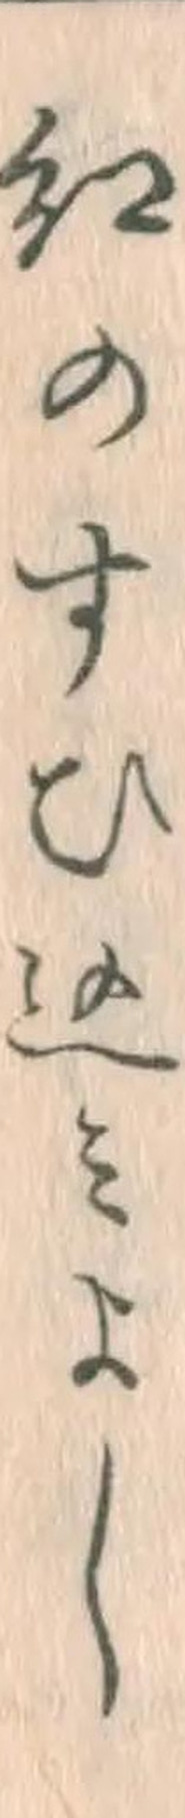紅のすひ込みよし
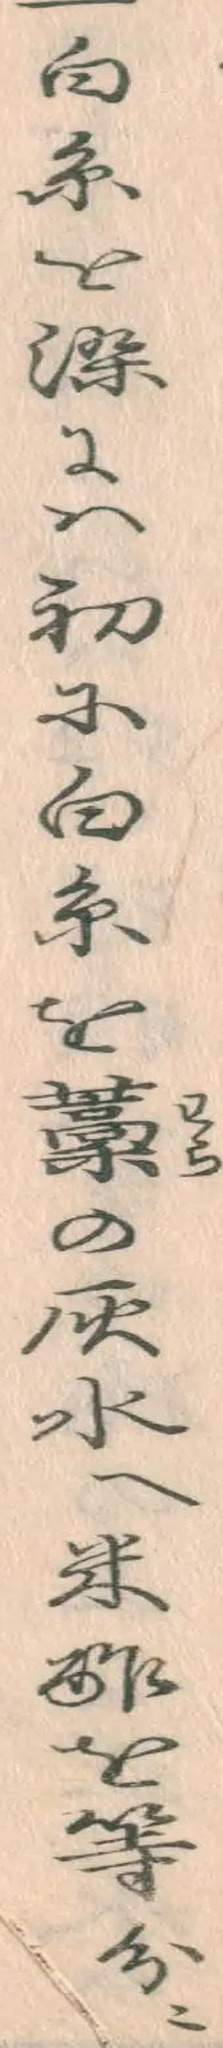一白糸を染には初に白糸を藁の灰水へ米酢を等分に
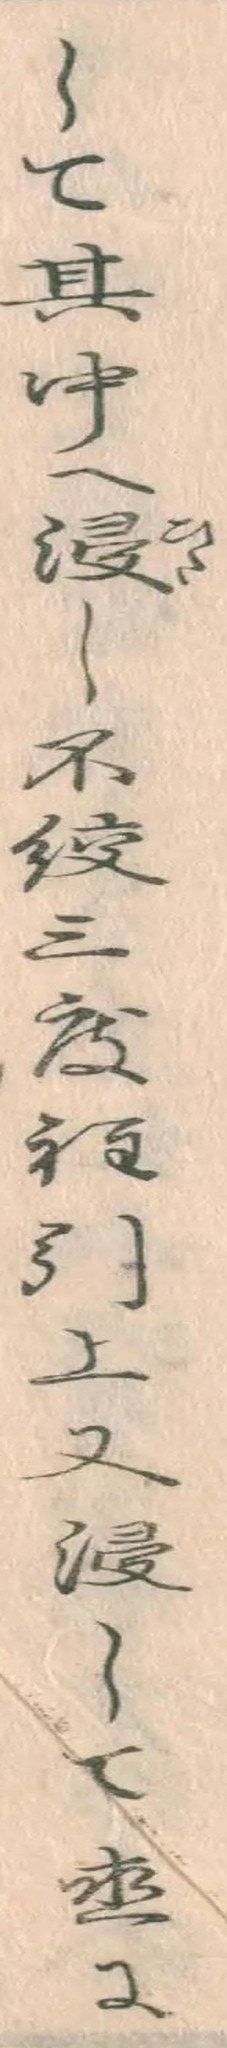して其中へ浸し不絞三度程引上又浸して直に
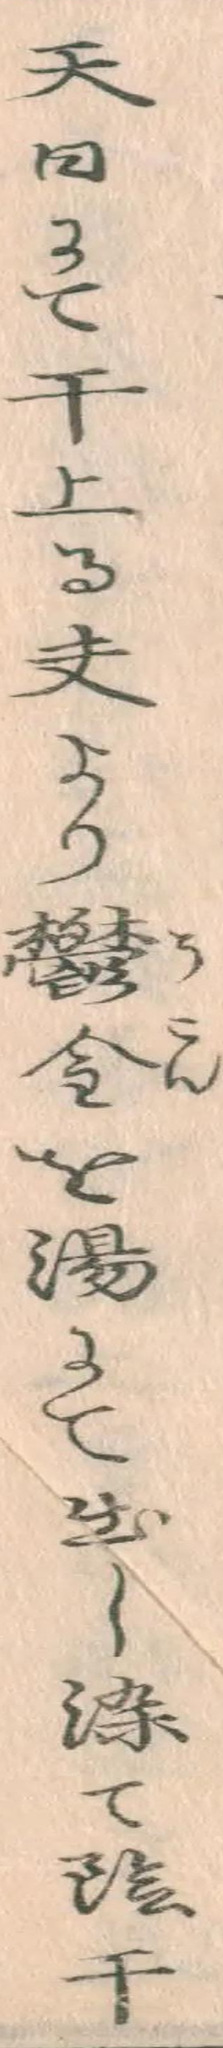天日にて干上る夫より鬱金を湯にて出し染て陰干
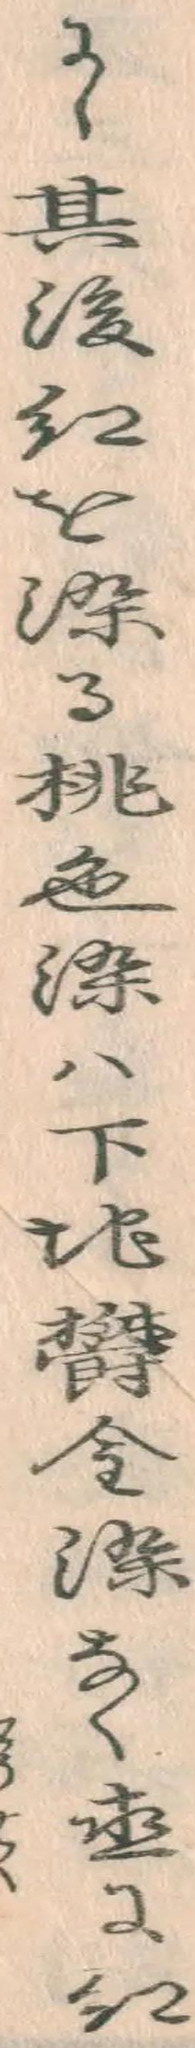にし其後紅を染る桃色染は下地鬱金染なく直に紅
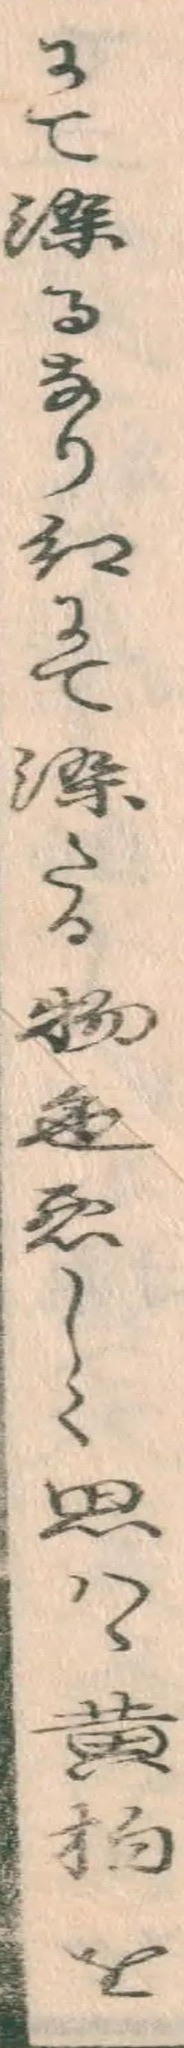にて染るなり紅にて染たる物色悪しく思はゝ黄柏を
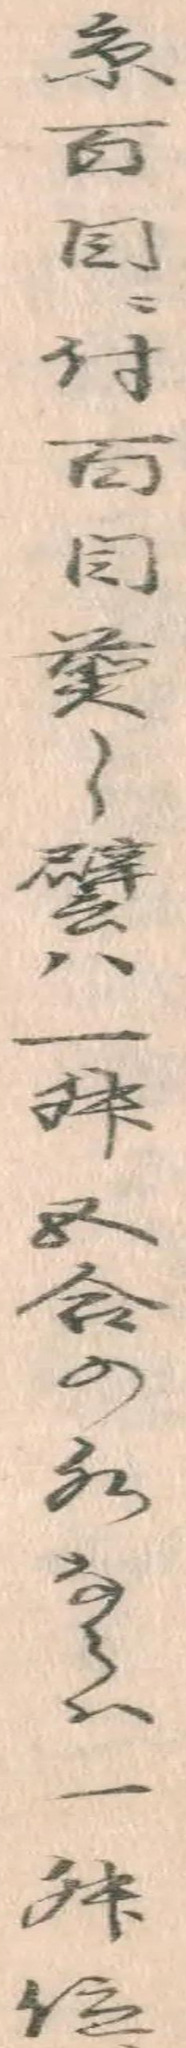糸百目に付百目煎し譬は一升五合の水ならは一升位に
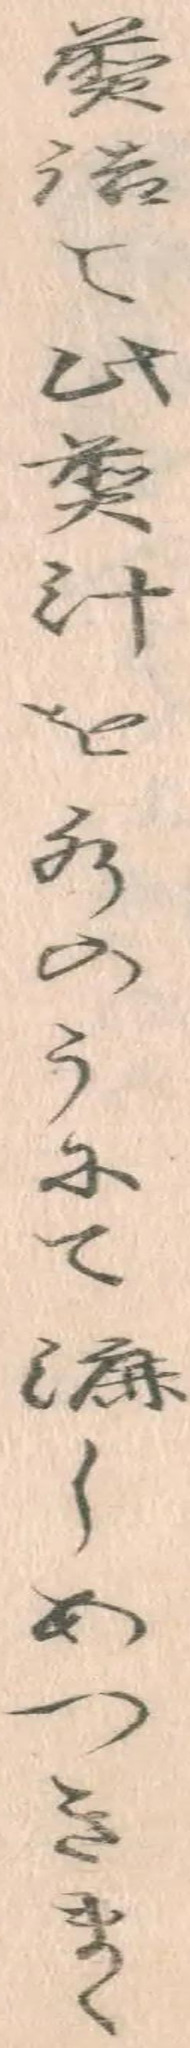煎詰て此煎汁を水のうにて漉しあつきまゝ
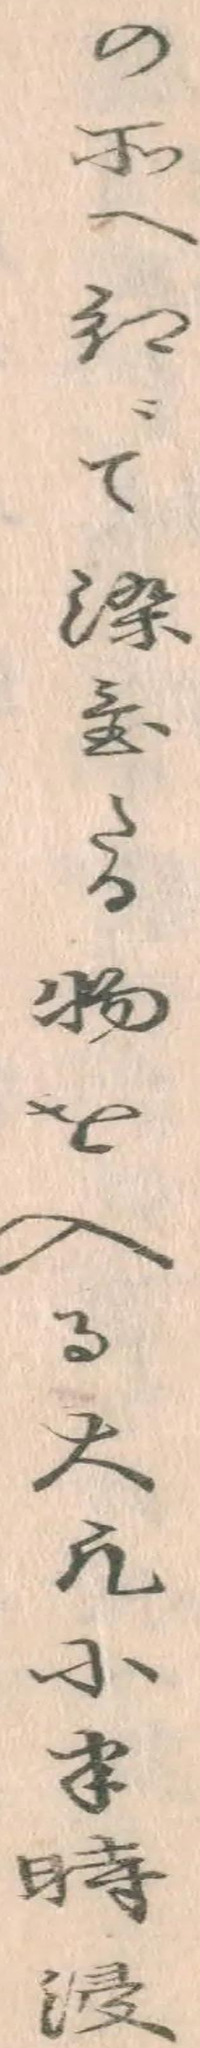の所へ紅にて染置たる物を入る大凡小半時浸
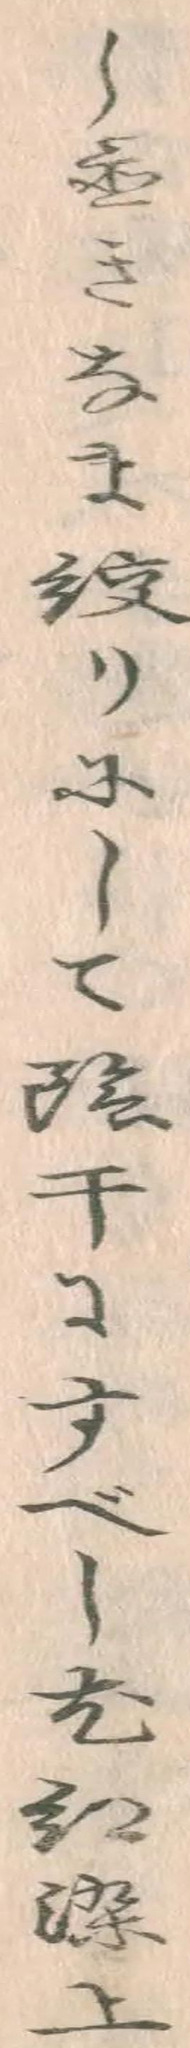し置きなま絞りにして陰干にすべし尤紅染上
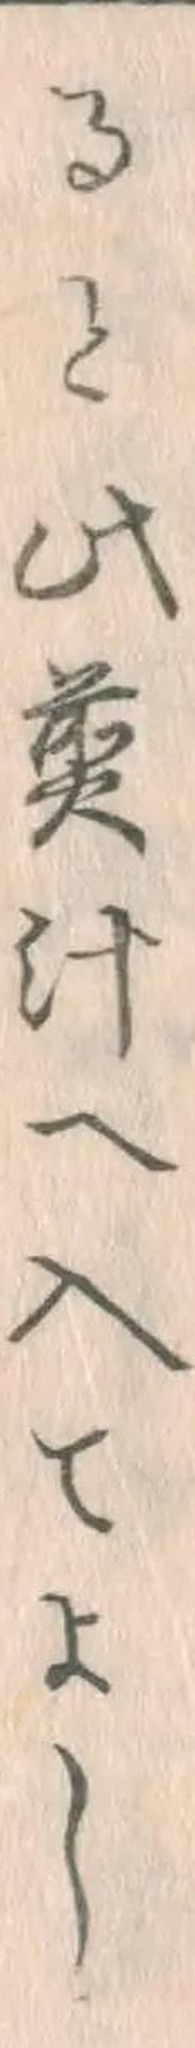ると此煎汁へ入てよし
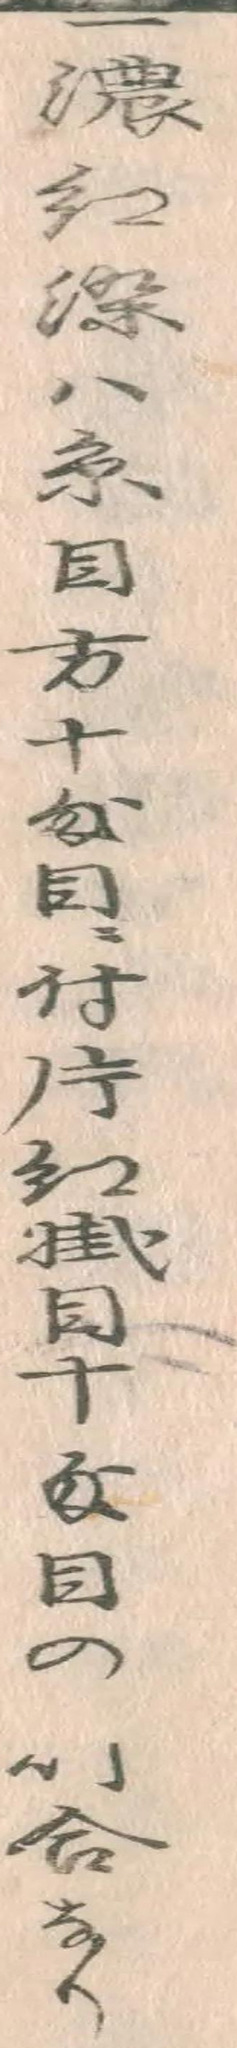一濃紅染は糸目方十匁目に付片紅掛目十匁目の割合なり
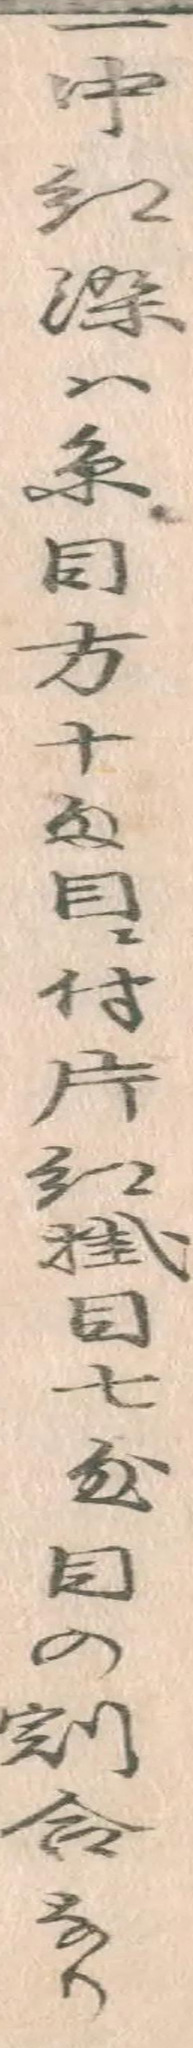一中紅染は糸目方十匁目に付片紅掛目七匁目の割合なり
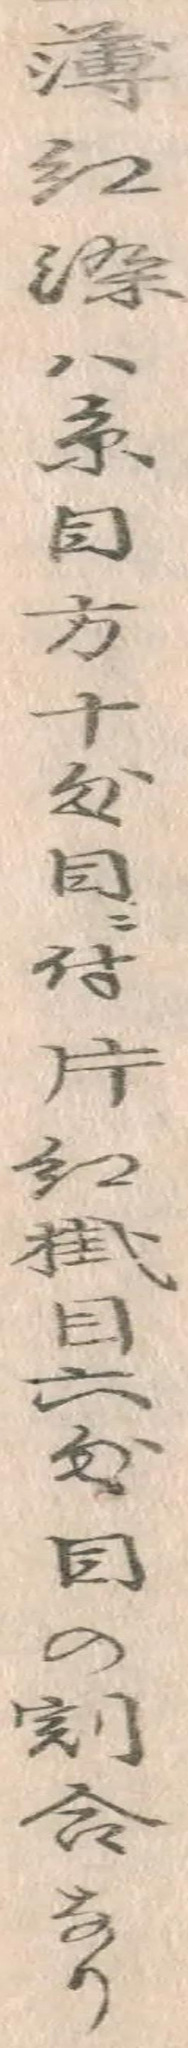一薄紅染は糸目方十匁目に付片紅掛目六匁目の割合なり
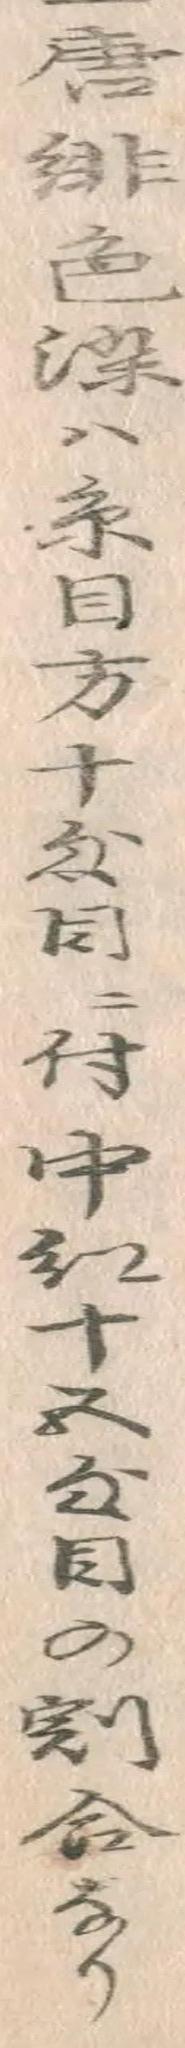一唐緋色染は糸目方十匁目に付中紅十五匁目の割合なり
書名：機織彙編 5巻. [1]
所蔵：国立国会図書館 National Diet Library, JAPAN
